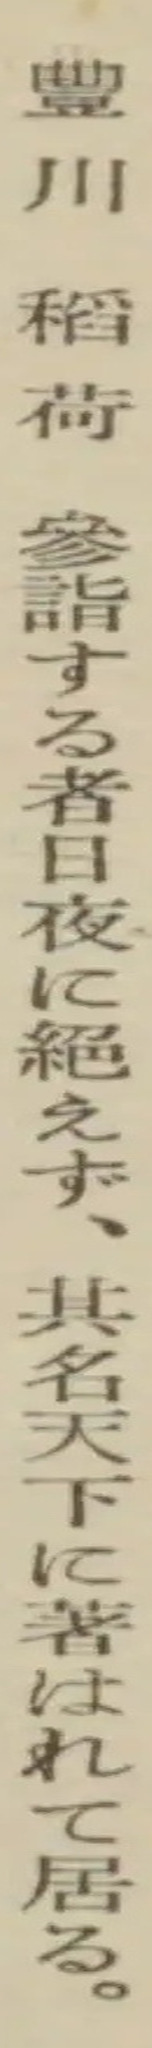豊川稲荷参詣する者日夜に絶えず、其名天下に著はれて居る。
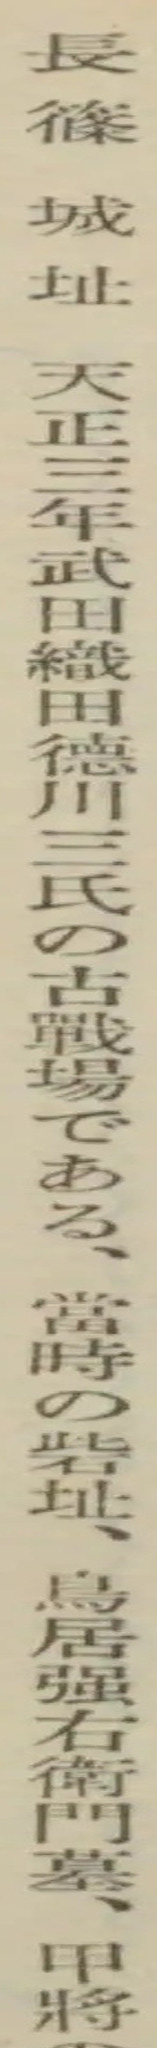長篠城址天正三年武田織田徳川三氏の古戦場である、当時の砦址、鳥居強右衛門墓、甲将の墳墓
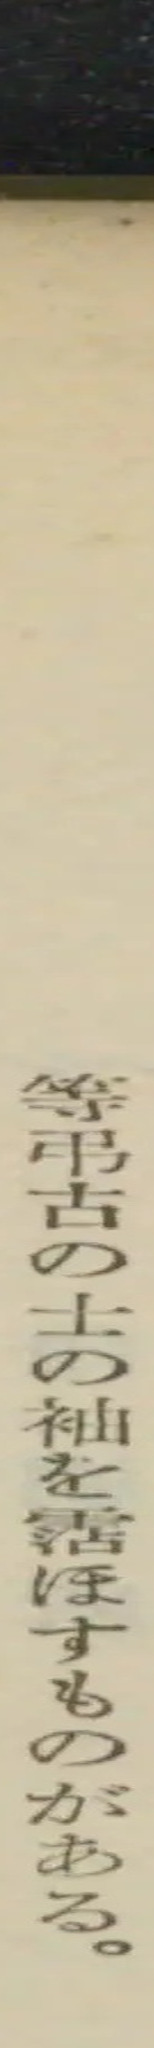等弔古の士の袖を霑ほすものがある。
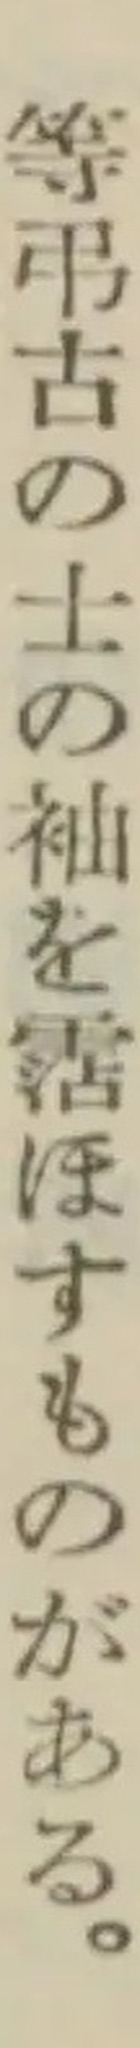等弔古の士の袖を霑ほすものがある。
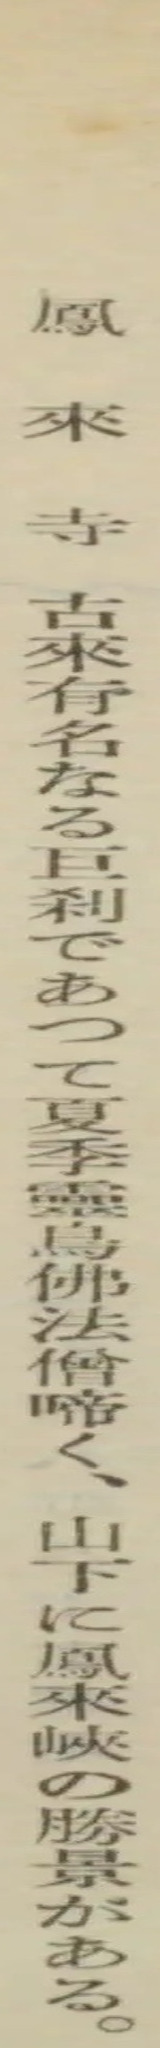鳳来寺古来有名なる巨刹であつて夏季霊鳥仏法僧啼く、山下に鳳来峡の勝景がある。

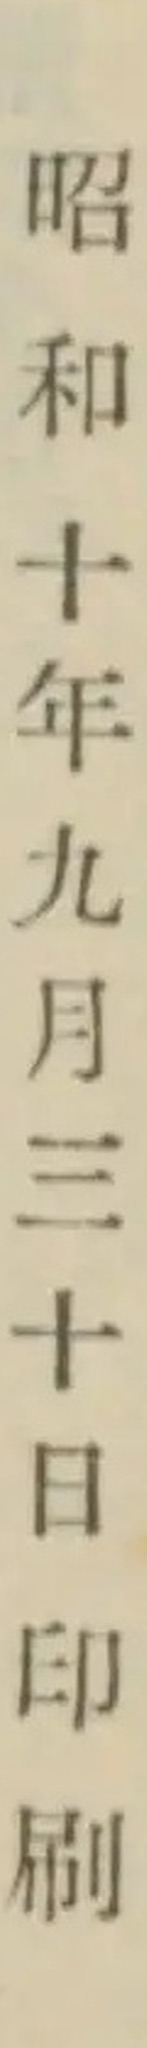昭和十年九月三十日印刷
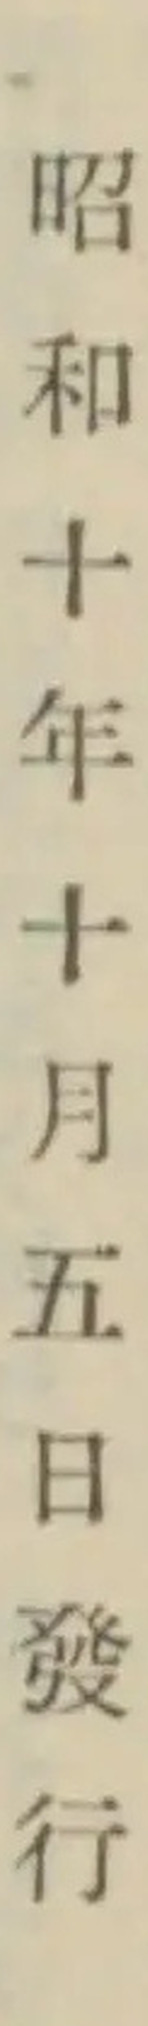昭和十年十月五日発行
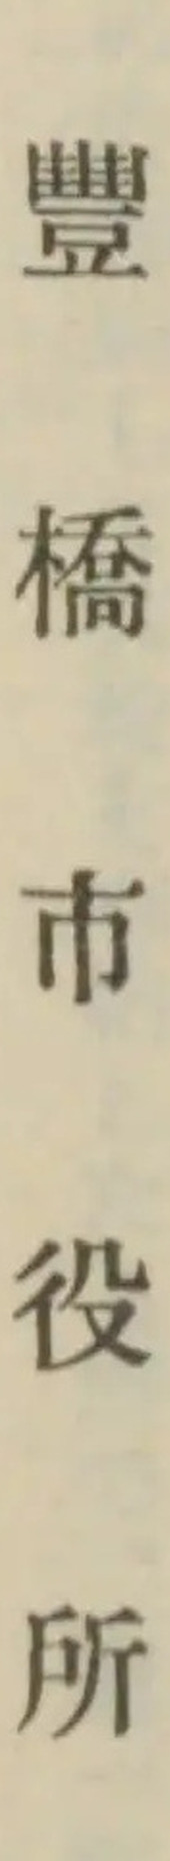豊橋市役所
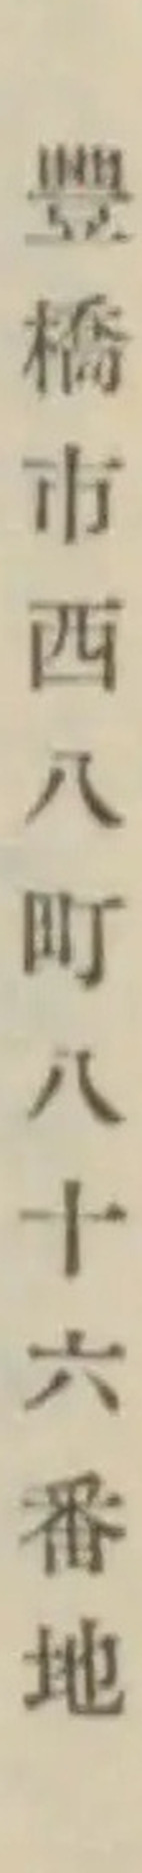豊橋市西八町八十六番地
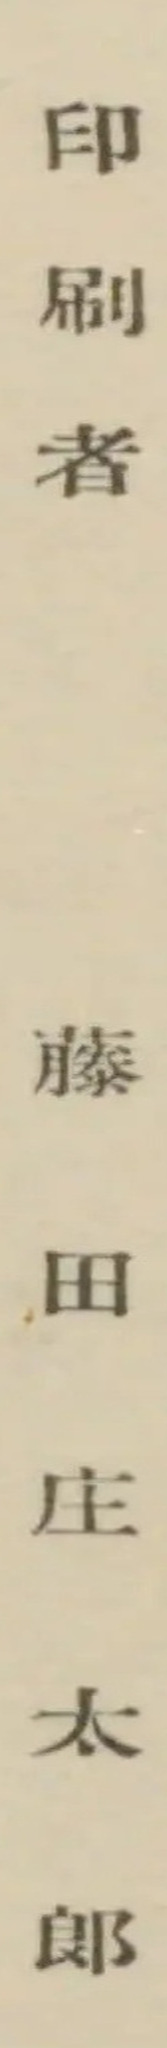印刷者藤田庄太郎
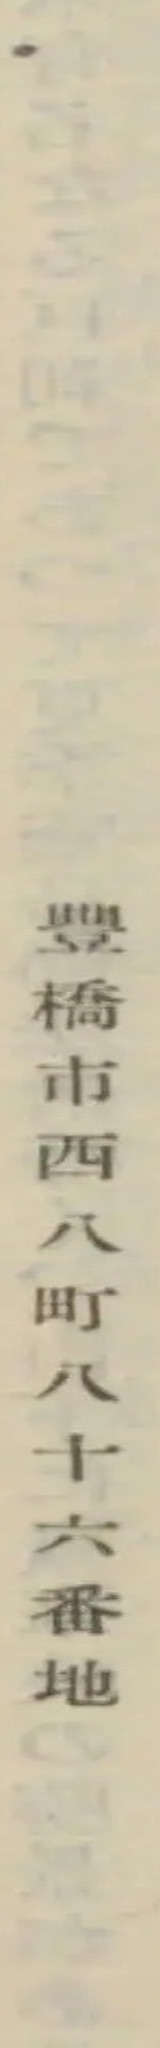豊橋市西八町八十六番地
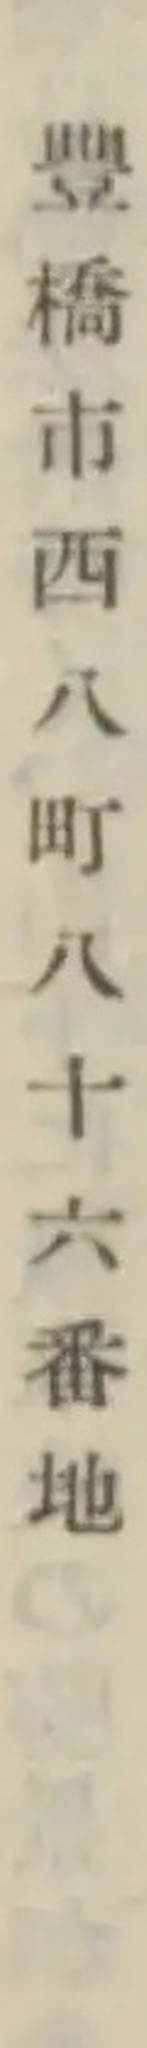豊橋市西八町八十六番地
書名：産業の豊橋
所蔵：国立国会図書館 National Diet Library, JAPAN
